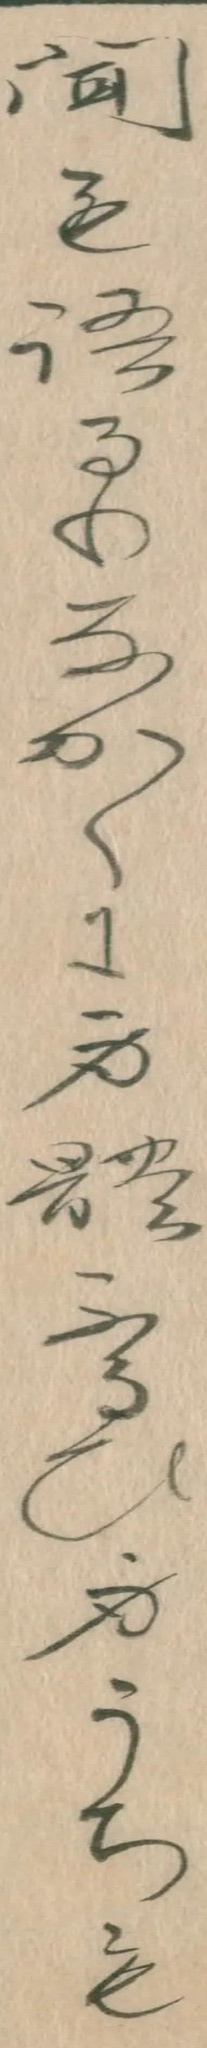聞も語るもなか〳〵に身体ふるひ身うちも
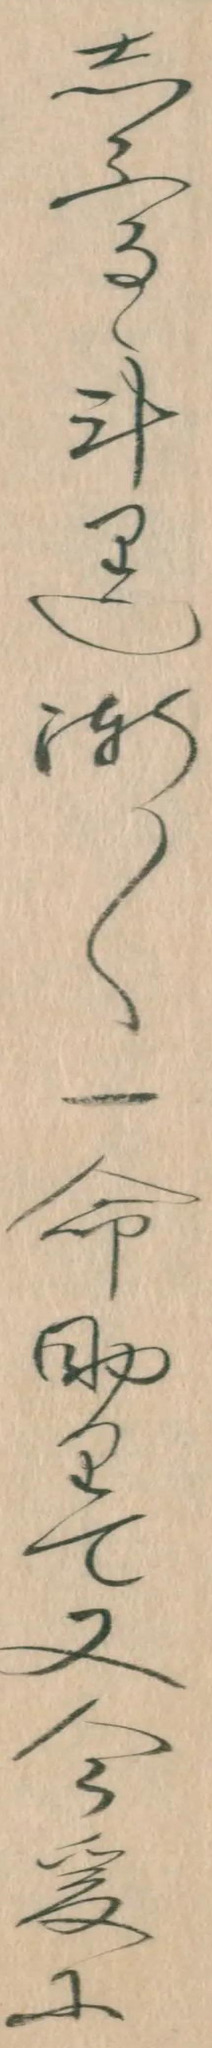しふるゝ斗り也漸く一命助りて又今爰に
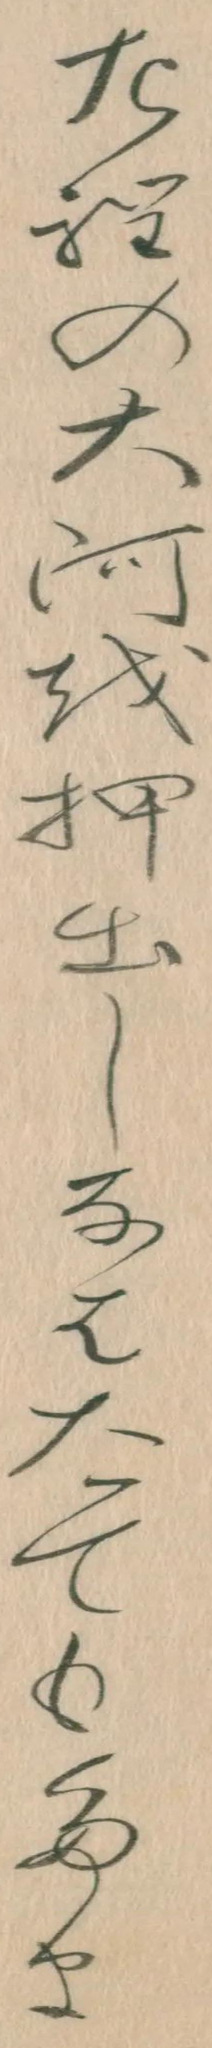左程の大河を押出しなはたてもたま
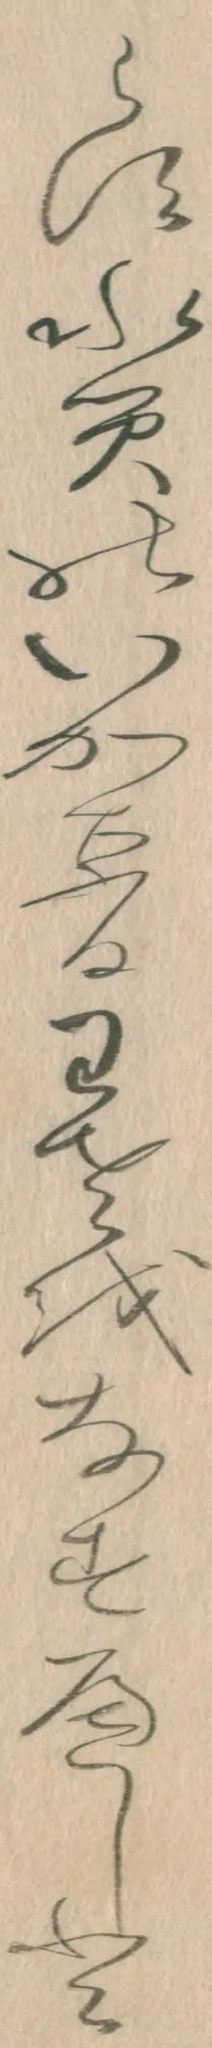らす水災のいかなるわさをなすへしと
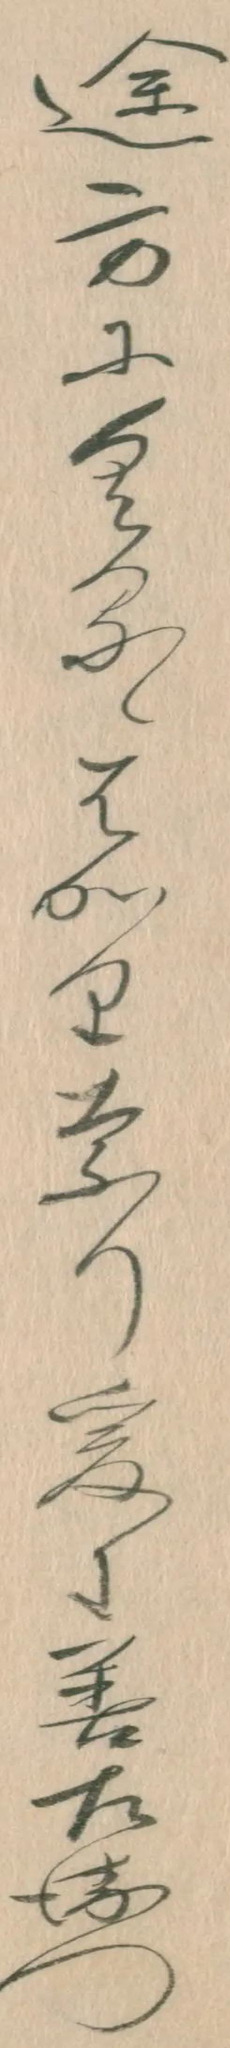途方にくるゝはかりなり爰に善左衛門
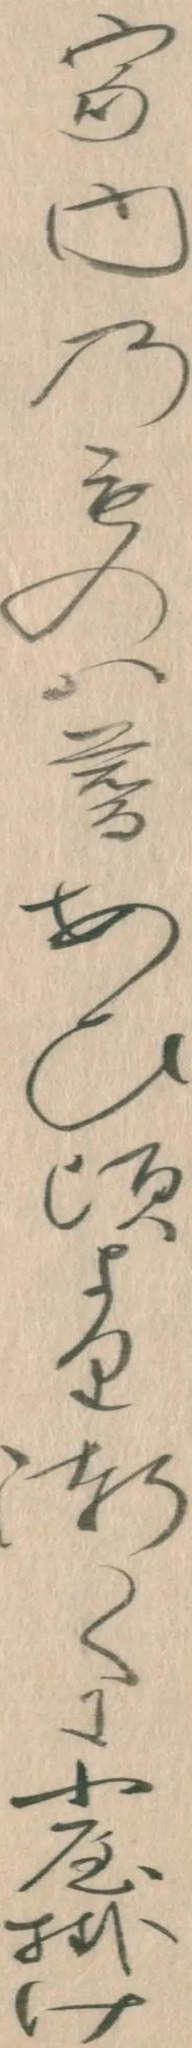家内のものは暮あひ頃より漸くに小屋掛け
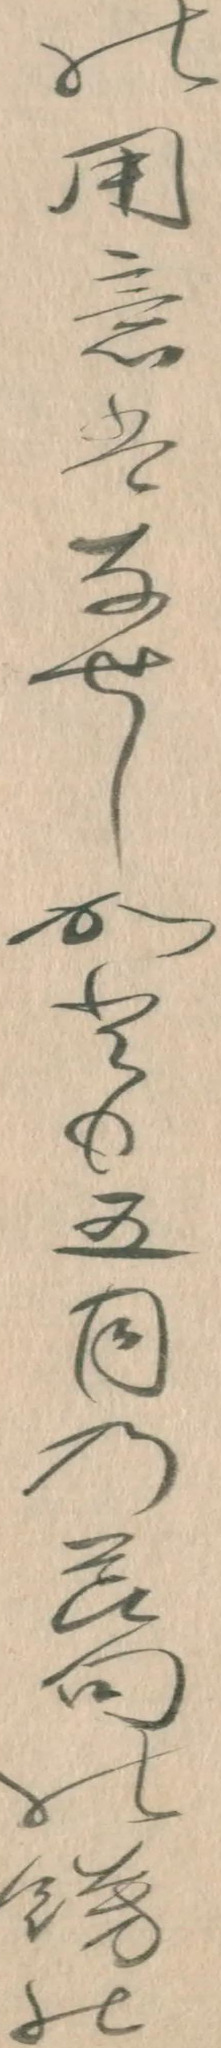の用意はなせしかとも五月の節句の飾の
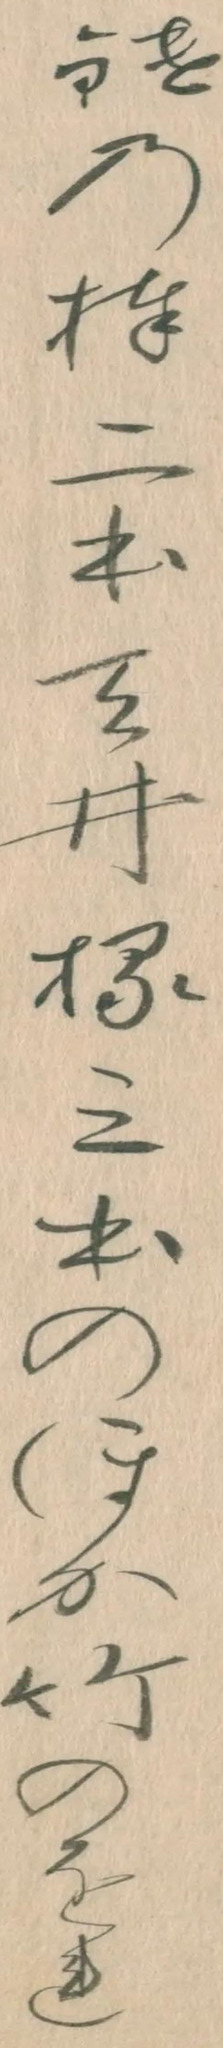鑓の棒二本天井椽三本のほか竹のをれ
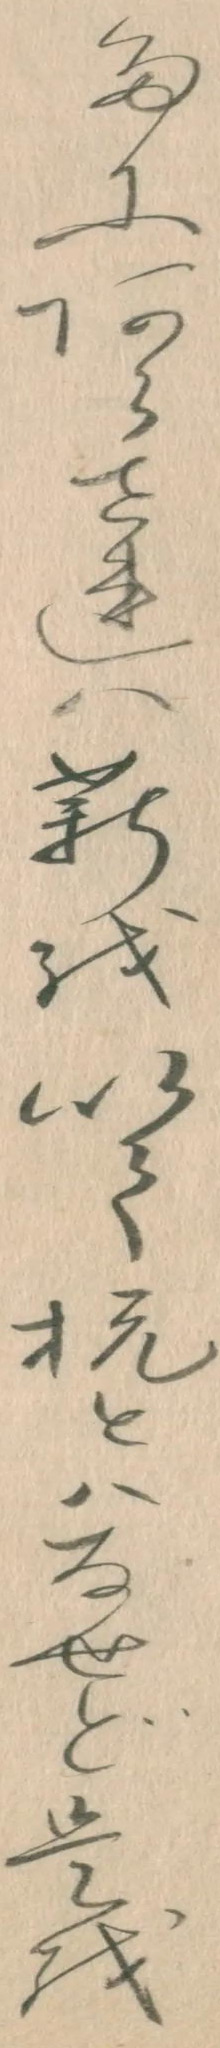たにあらされは薪を以て杭とはなせど是を
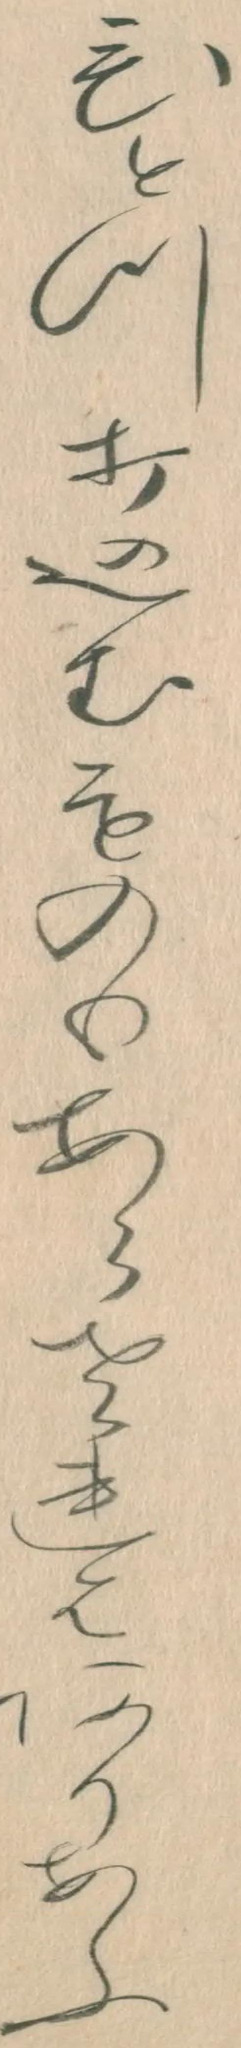ひとつ打込むものもあらされはありあふ
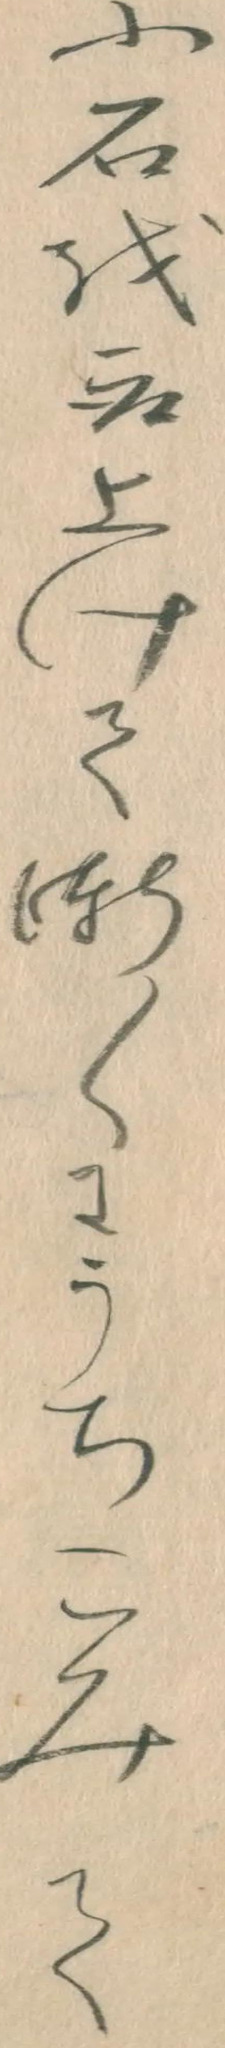小石を取上けて漸くにうちこみて

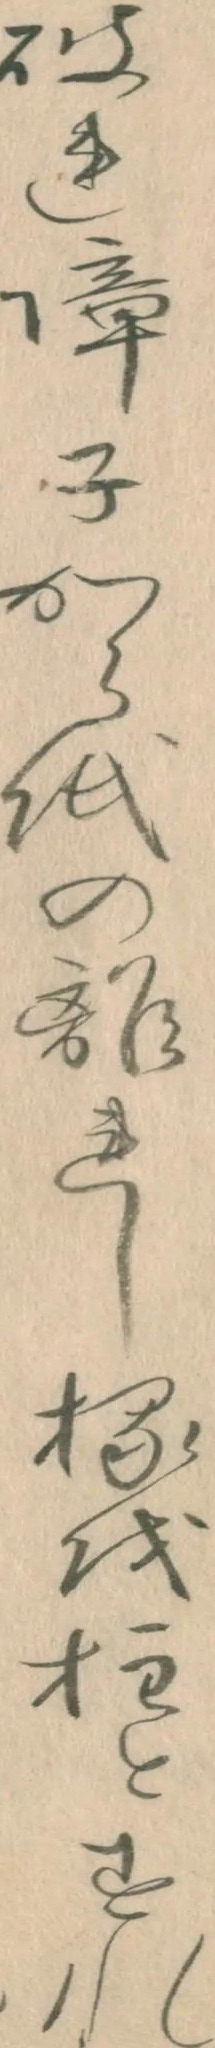破れ障子から紙の離れした椽を柱とすれ
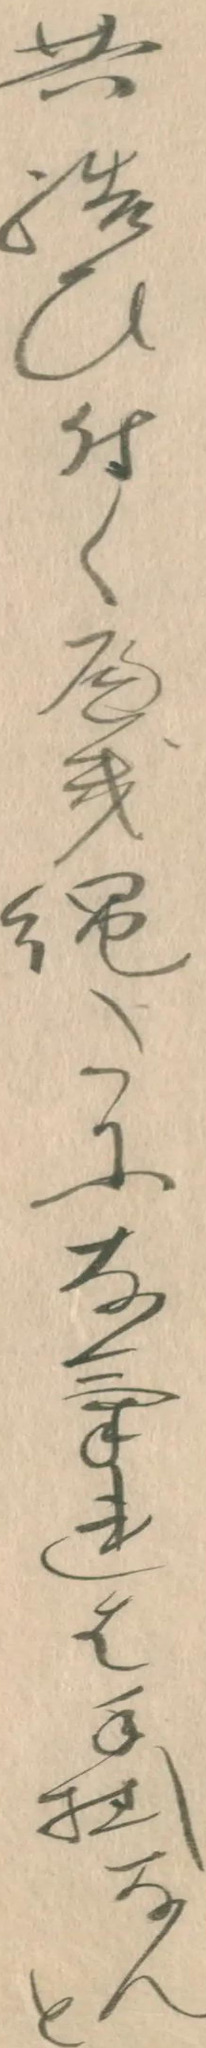共結ひ付くへき縄たになけれは手拭なんと
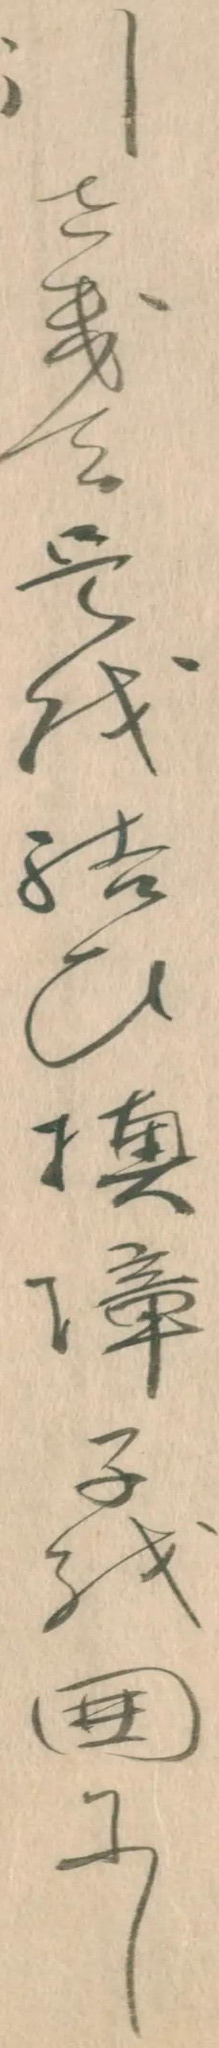引さきて是を結ひ襖障子を囲にし
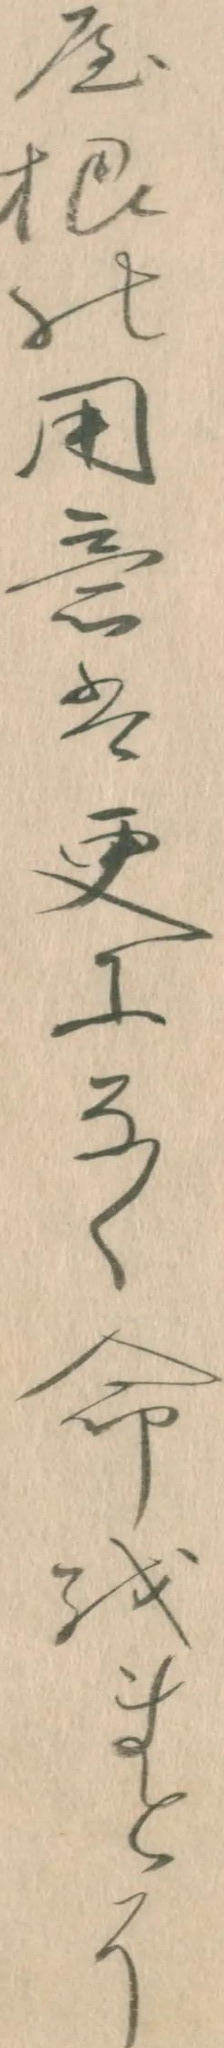屋根の用意は更になく命をまとに
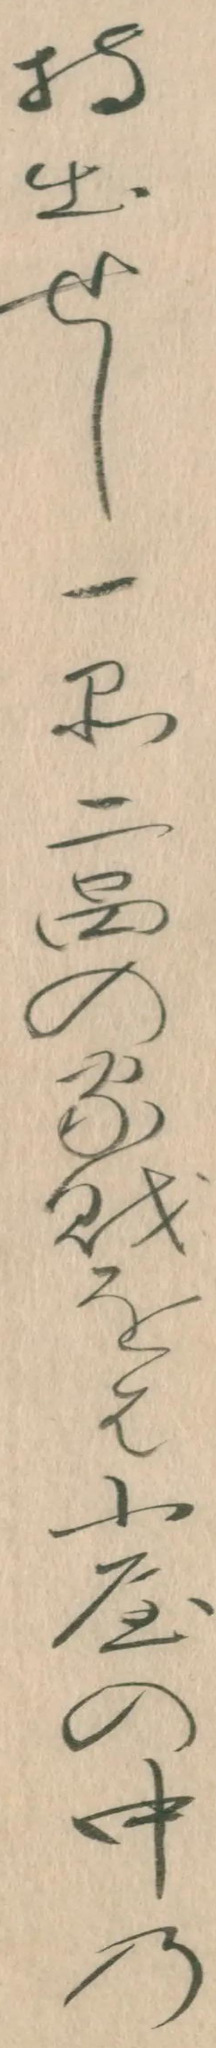持ち出せし一品二品の家財をは小屋の中の
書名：俗語之種. [5]
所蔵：国立国会図書館 National Diet Library, JAPAN
